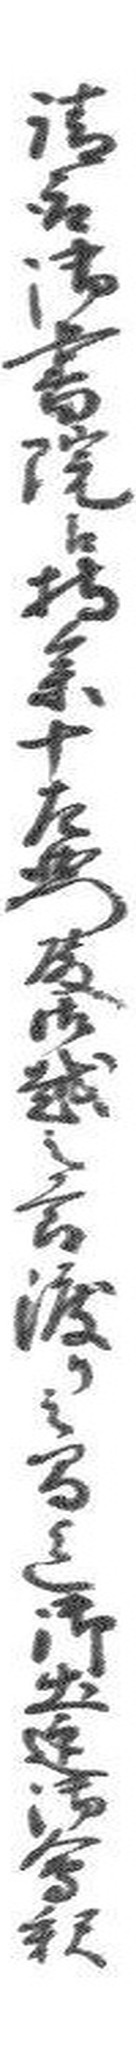請取御書院江持参十左衛門殿御越之節渡り之間迄御出迎御会釈
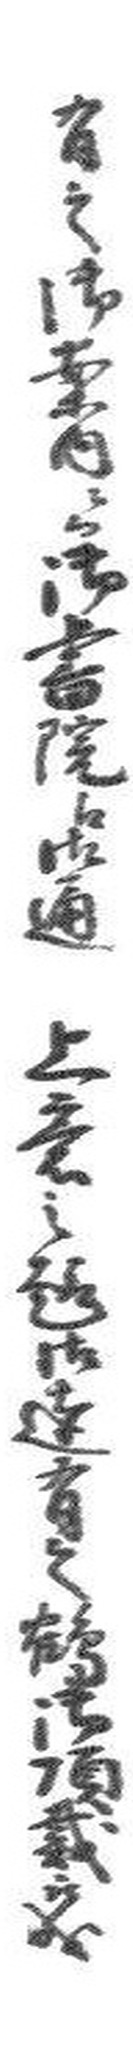有之御案内ニ而御書院江御通上意之趣御達有之鶴御頂戴被成
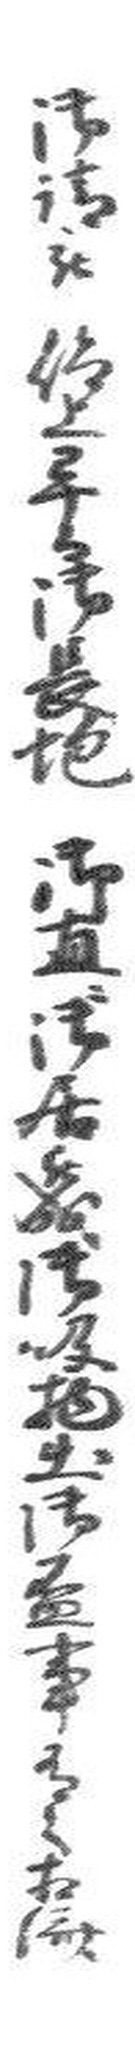御請被仰上畢而御長蚫御直ニ御居被成御吸物出御盃事有之相済
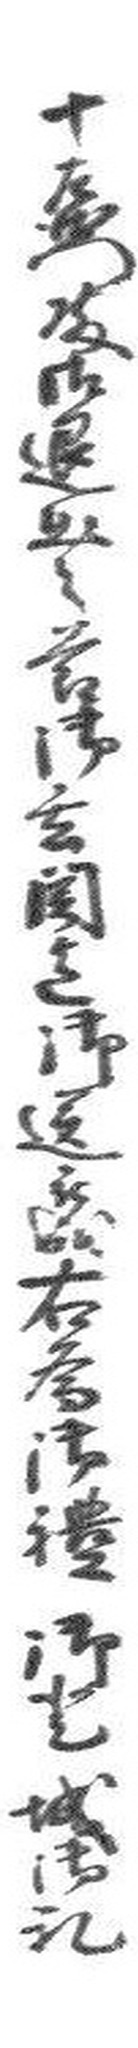十左衛門殿御退出之節御玄関迄御送被成右為御礼御登城御礼
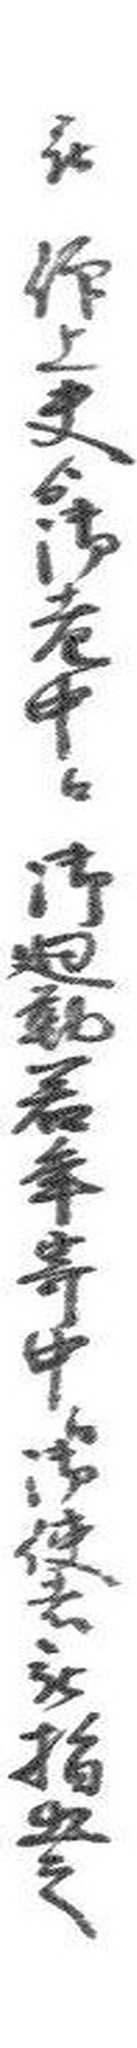被仰上夫ゟ御老中江御廻勤若年寄中江御使者被指出之
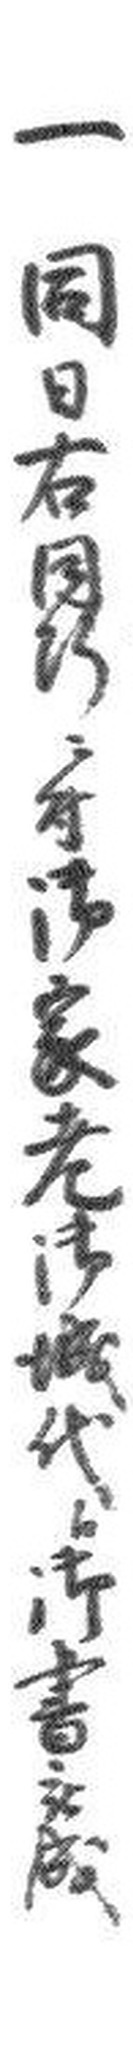一同日右同断ニ付御家老御城代江御書被成
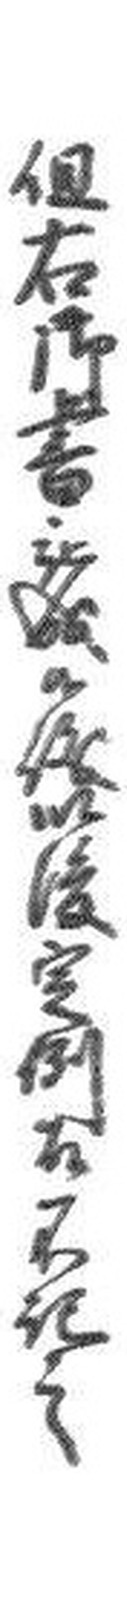但右御書被成候儀以後定例故不記之

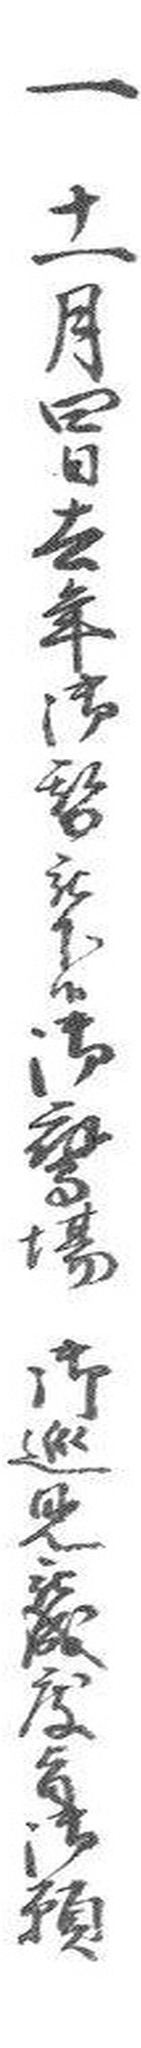一十一月四日去年御替被下候御鷹場御巡見被成度旨御願
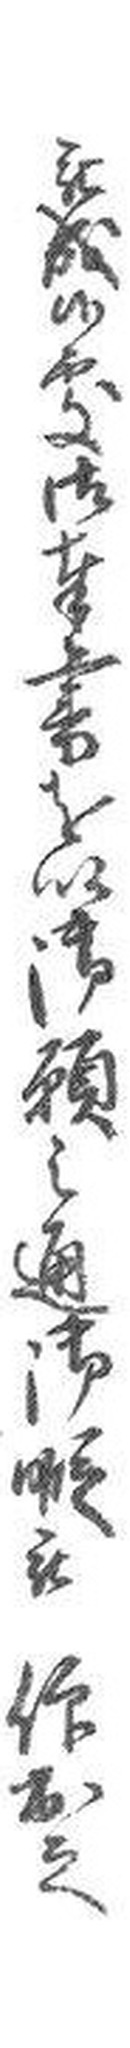被成候処御奉書を以御願之通御暇被仰出之
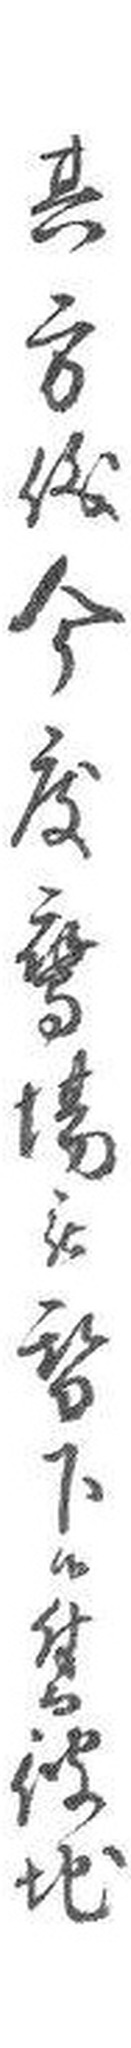其方儀今度鷹場被替下候付而彼地
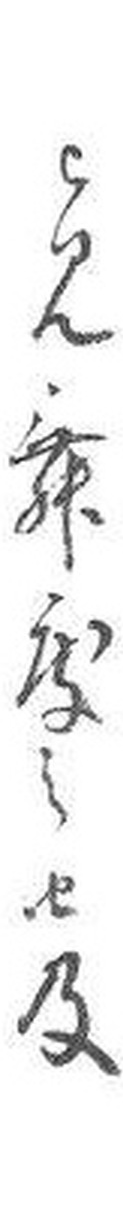被見舞度之由及
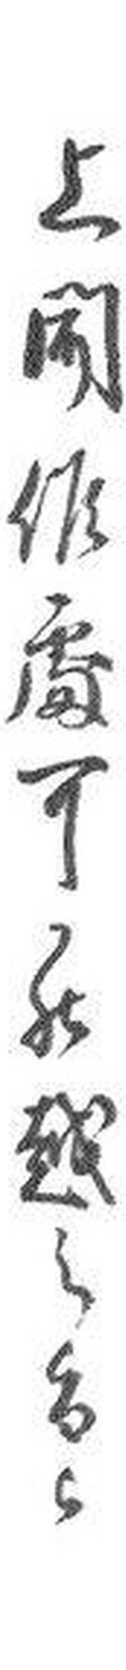上聞候処可罷越之旨被
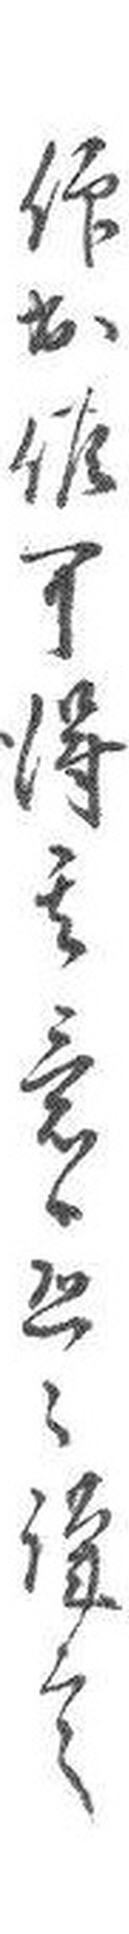仰出候可得其意候恐々謹言
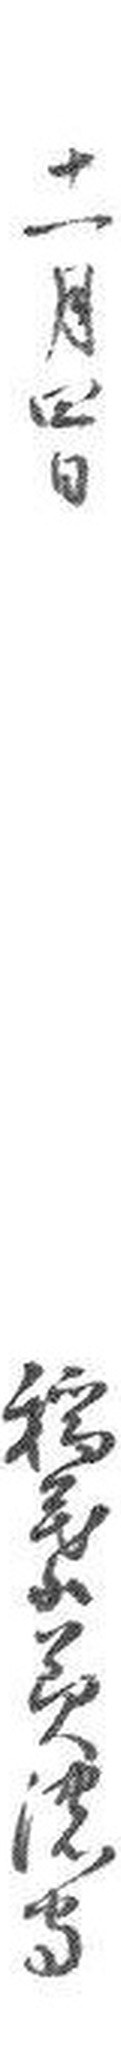十一月四日稲葉美濃守
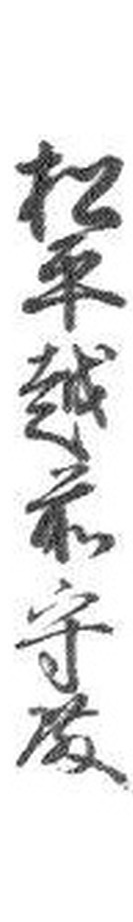松平越前守殿
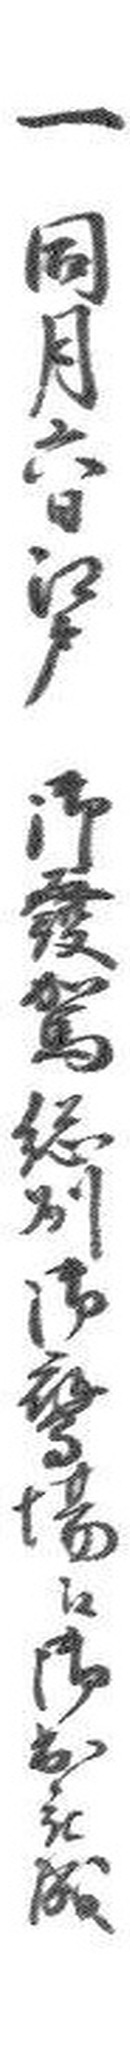一同月六日江戸御発駕総州御鷹場江御出被成
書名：家譜 六 光通公 従万治三年到寛文三年
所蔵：福井県文書館 Fukui Prefectural Archives
